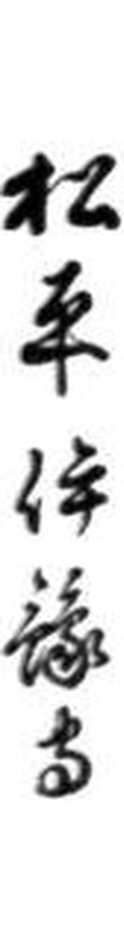松平伊予守
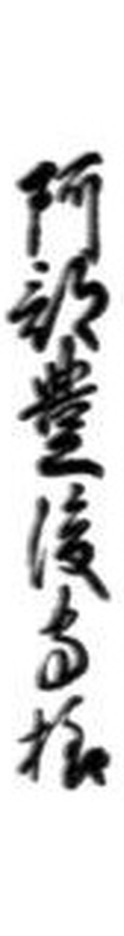阿部豊後守殿
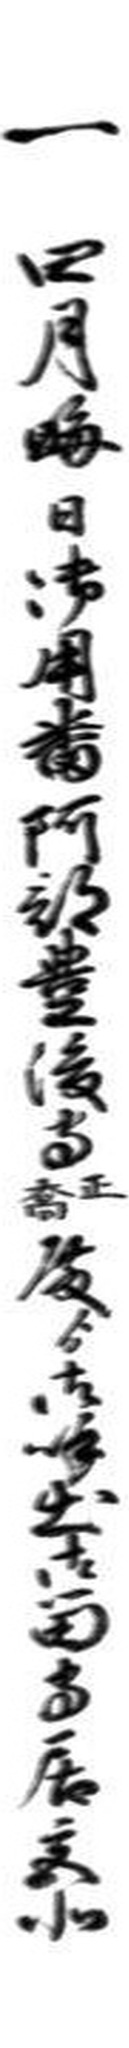一四月晦日御用番阿部豊後守正喬殿ゟ御呼出御留守居宮北
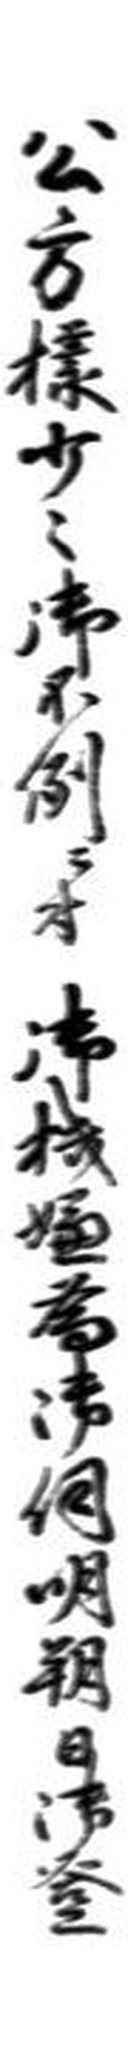公方様少々御不例ニ付御機嫌為御伺明朔日御登
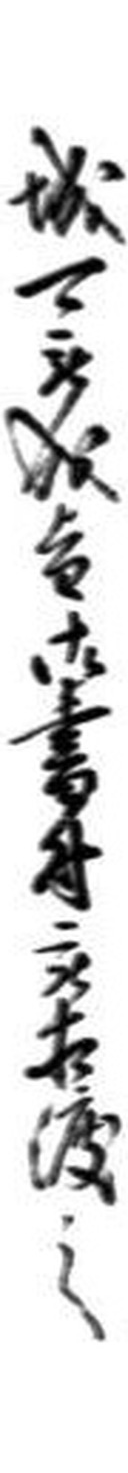城可被成旨御書付被相渡之
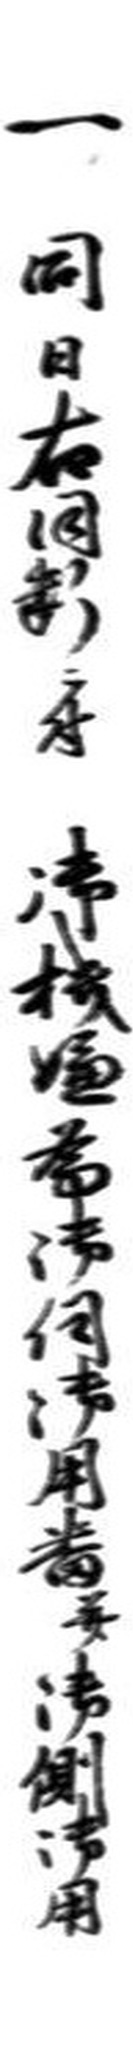一同日右同断ニ付御機嫌為御伺御用番并御側御用
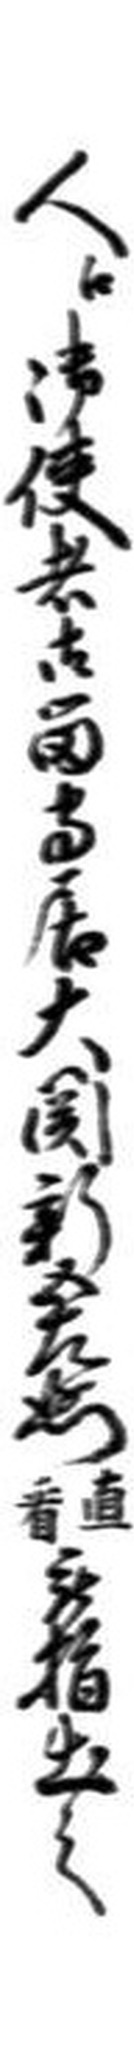人江御使者御留守居大関新五左衛門直看被指出之
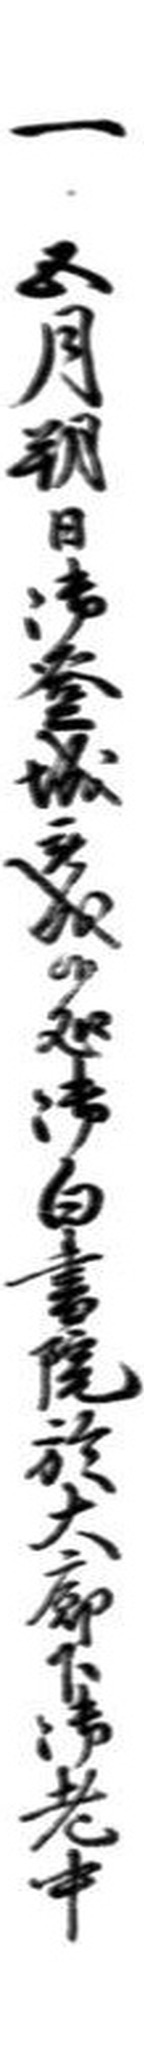一五月朔日御登城被成候処御白書院於大廊下御老中
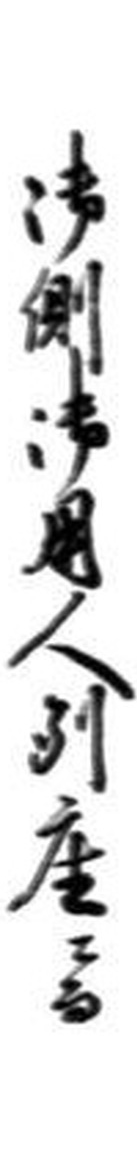御側御用人列座ニ而
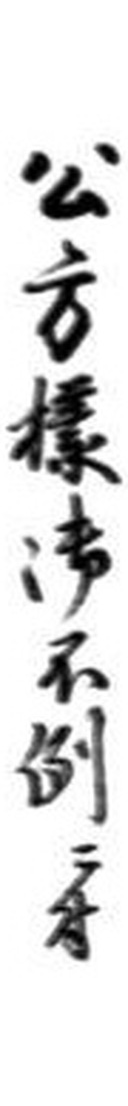公方様御不例ニ付

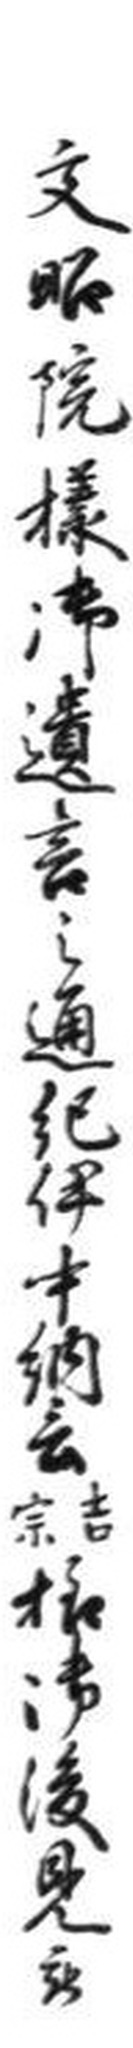文昭院様御遺言之通紀伊中納言吉宗様御後見被
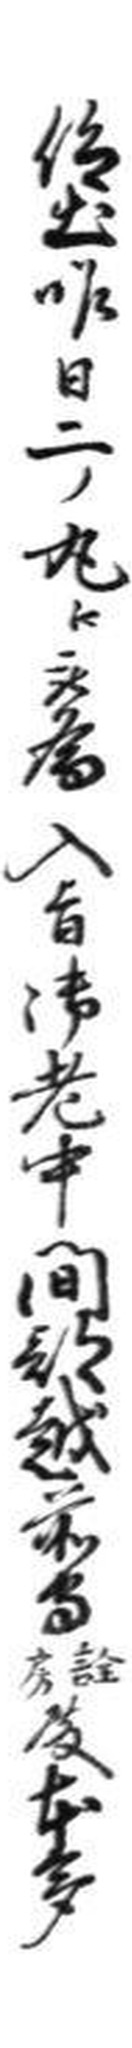仰出昨日二ノ丸江被為入旨御老中間部越前守詮房殿本多
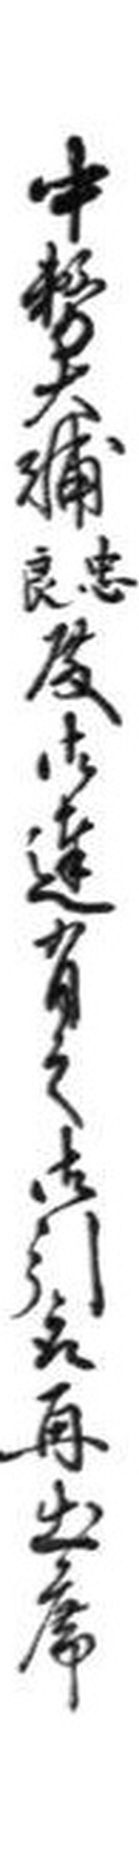中務大輔忠良殿御達有之御引取再出席
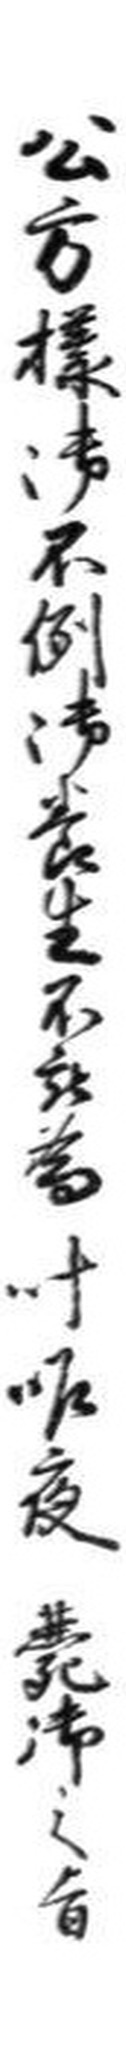公方様御不例御養生不被為叶昨夜薨御之旨
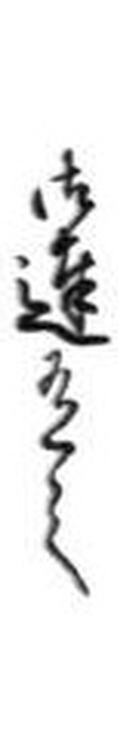御達有之
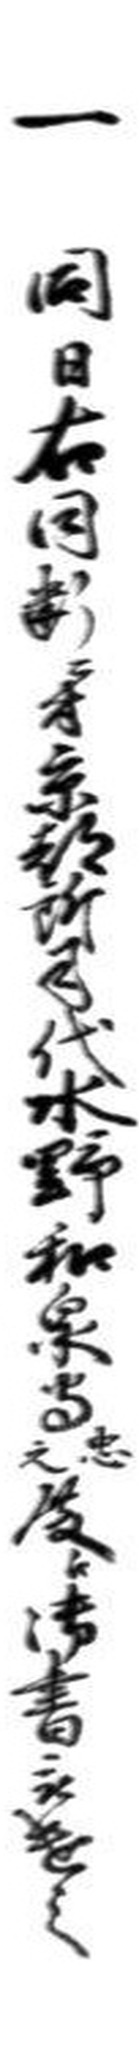一同日右同断ニ付京都所司代水野和泉守忠元殿江御書被遣之
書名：家譜 三十一 吉邦公 享保元年
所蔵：福井県文書館 Fukui Prefectural Archives
